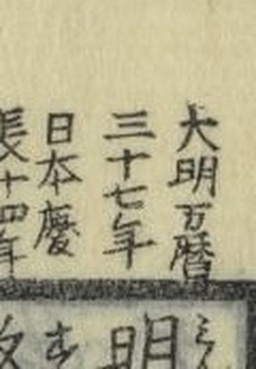三十七年
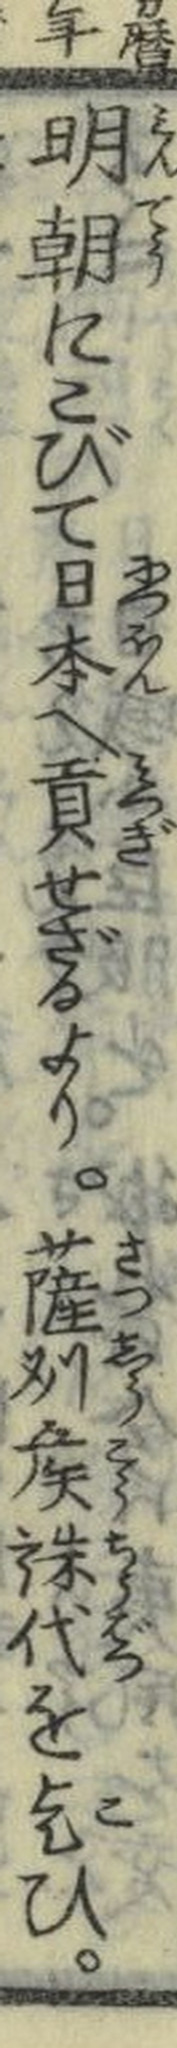明朝にこびて日本へ貢せざるより。薩州侯誅伐を乞ひ。
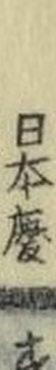日本慶
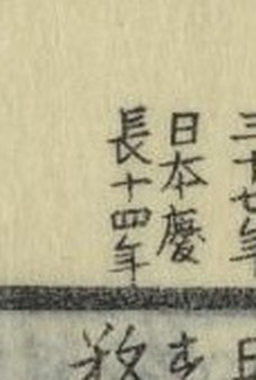長十四年
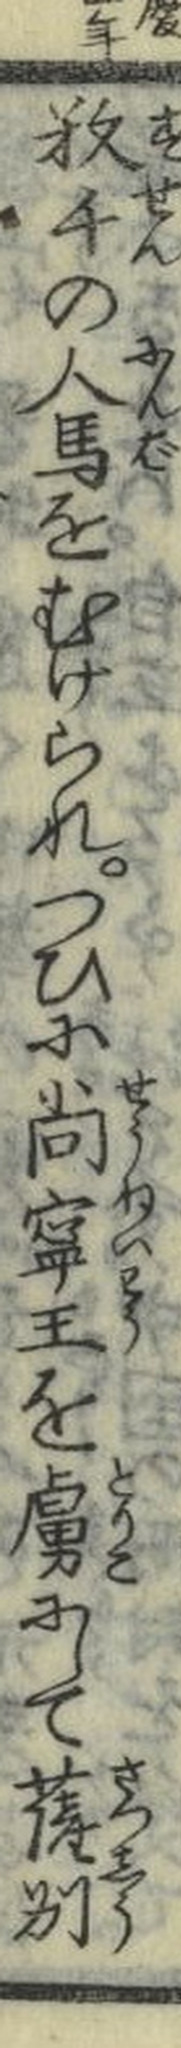数千の人馬をむけられ。つひに尚寧王を虜にして薩州
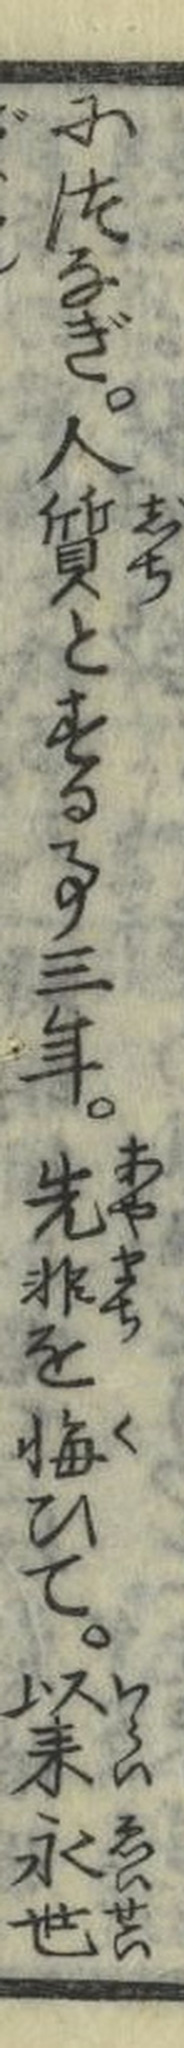につなぎ。人質とする事三年。先非を悔ひて。以来永世
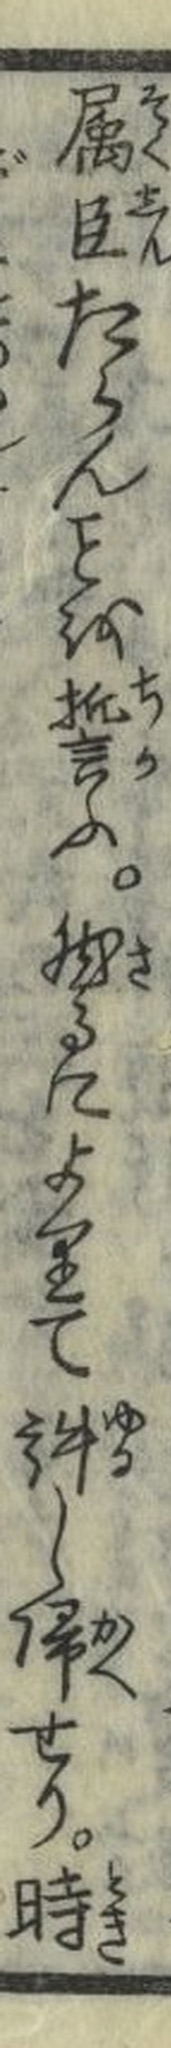属臣たらんことを誓ふ。然るによりて許し帰せり。時
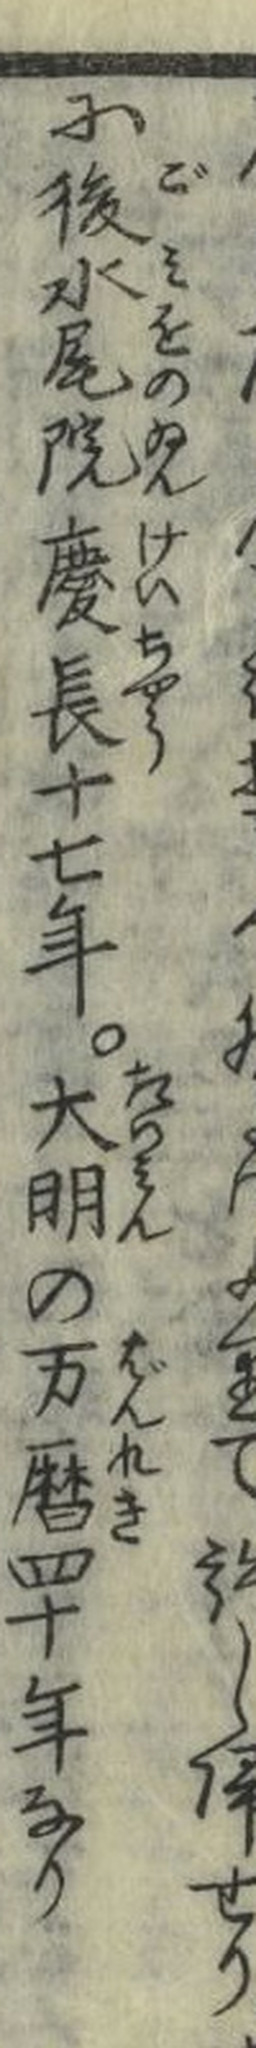に後水尾院慶長十七年。大明の万暦四十年なり

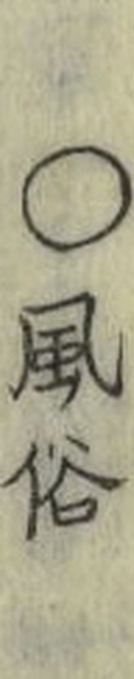○風俗
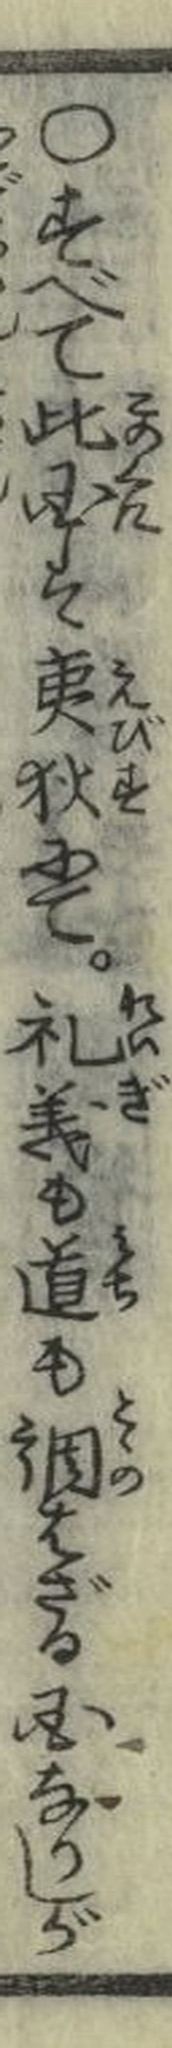○すべて此国は夷狄にて。礼義も道も調はざる国なりしが
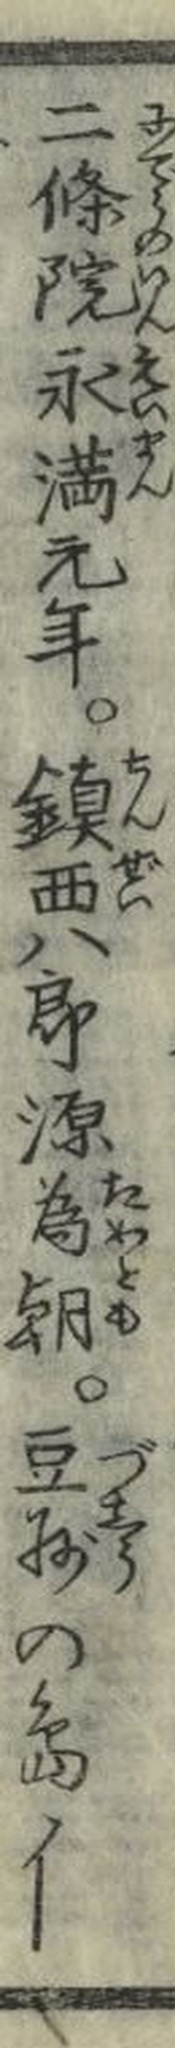二條院永満元年。鎮西八郎源為朝。豆州の島に
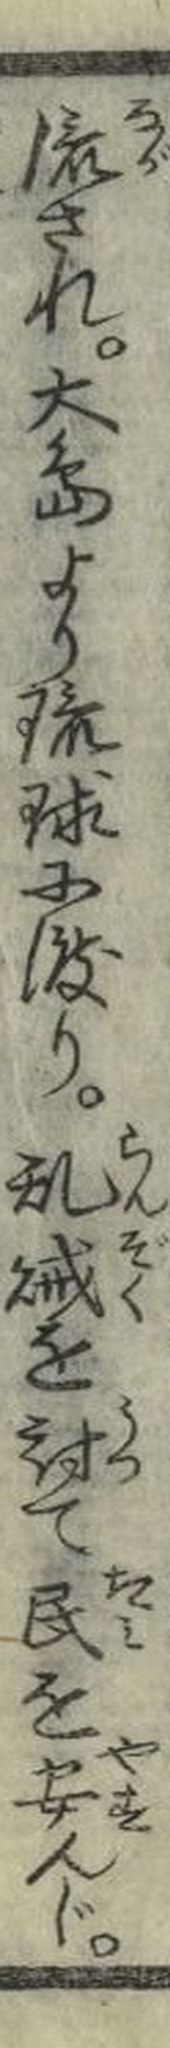流され。大島より琉球に渡り。乱賊を討て民を安んじ。
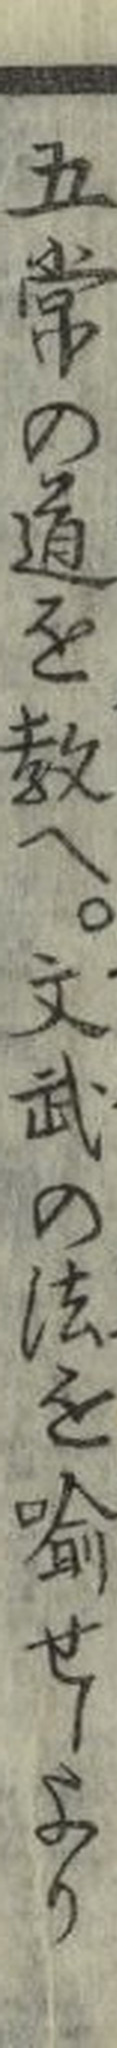五常の道を教へ。文武の法を諭せしより
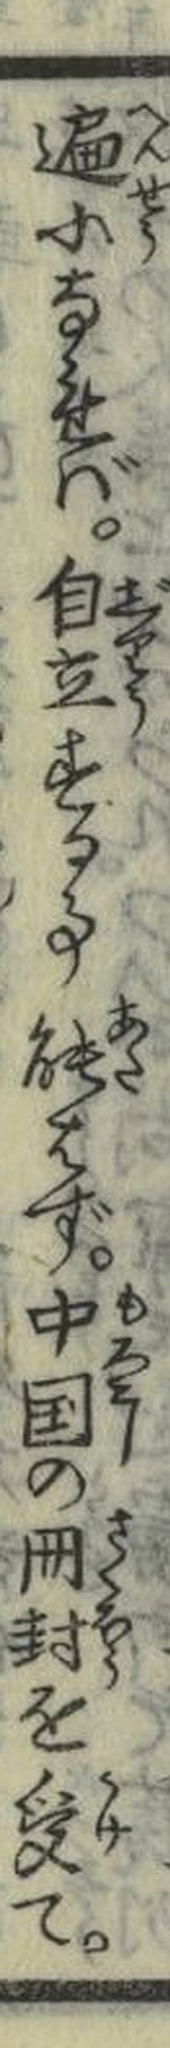遍小なるれば。自立する事能はず。中国の冊封を受て。
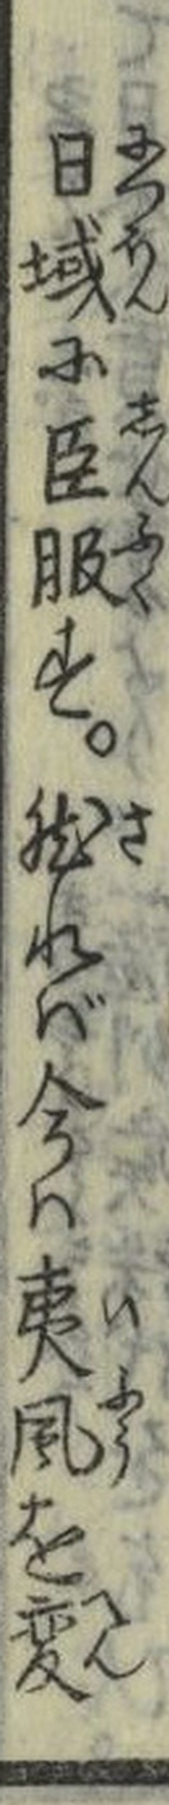また日域に臣服す。然れば今は夷風を変
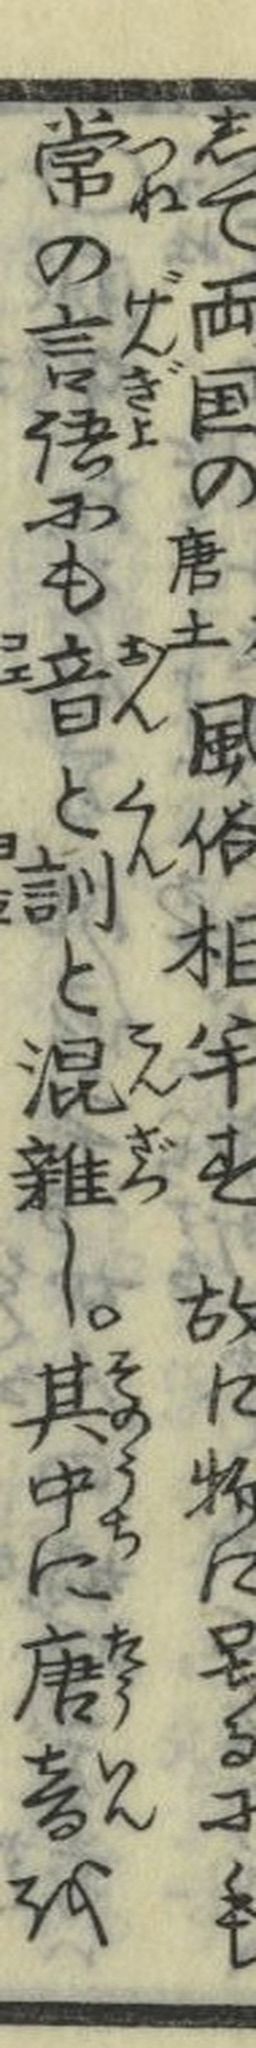常の言語にも音と訓と混雑し。其中に唐音を
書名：琉球奇譚
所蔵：University of the Ryukyus Library
